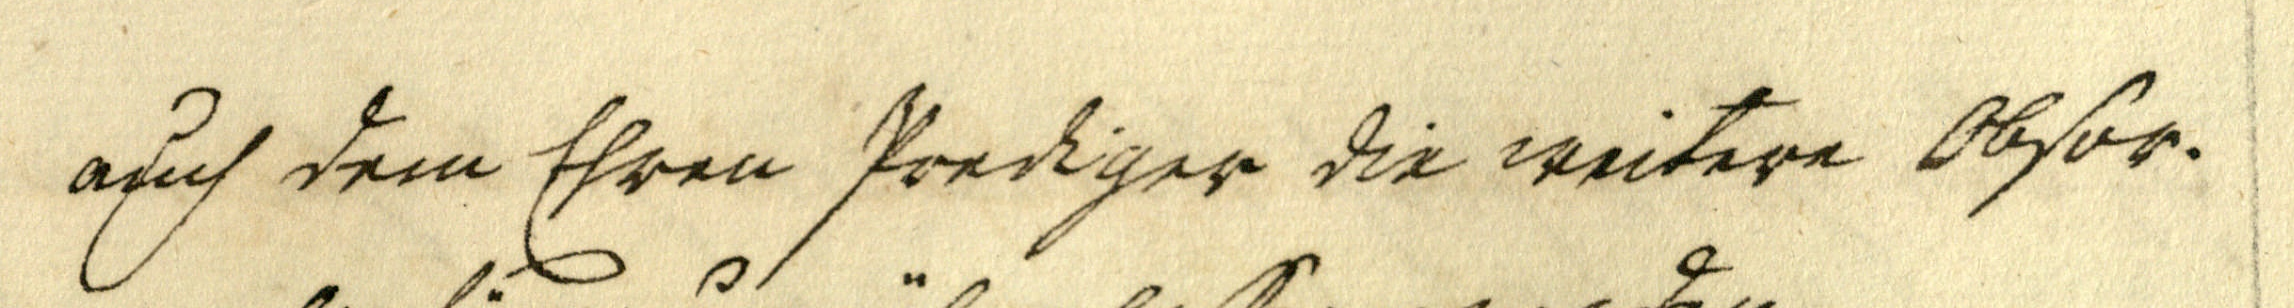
auch dem Ehren Prediger die weitere Obsor¬
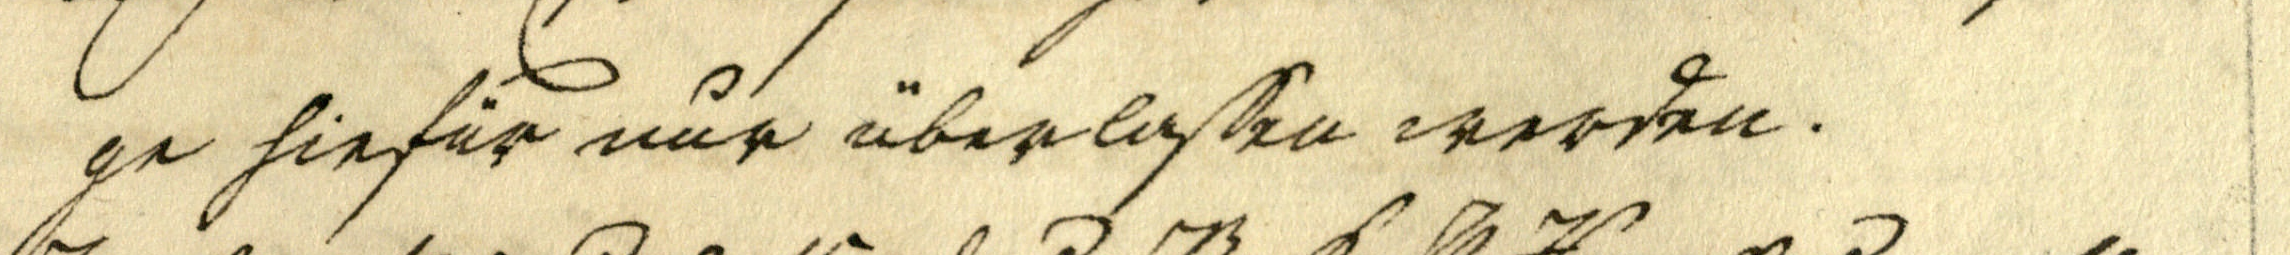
ge hiefür nur überlassen werden.
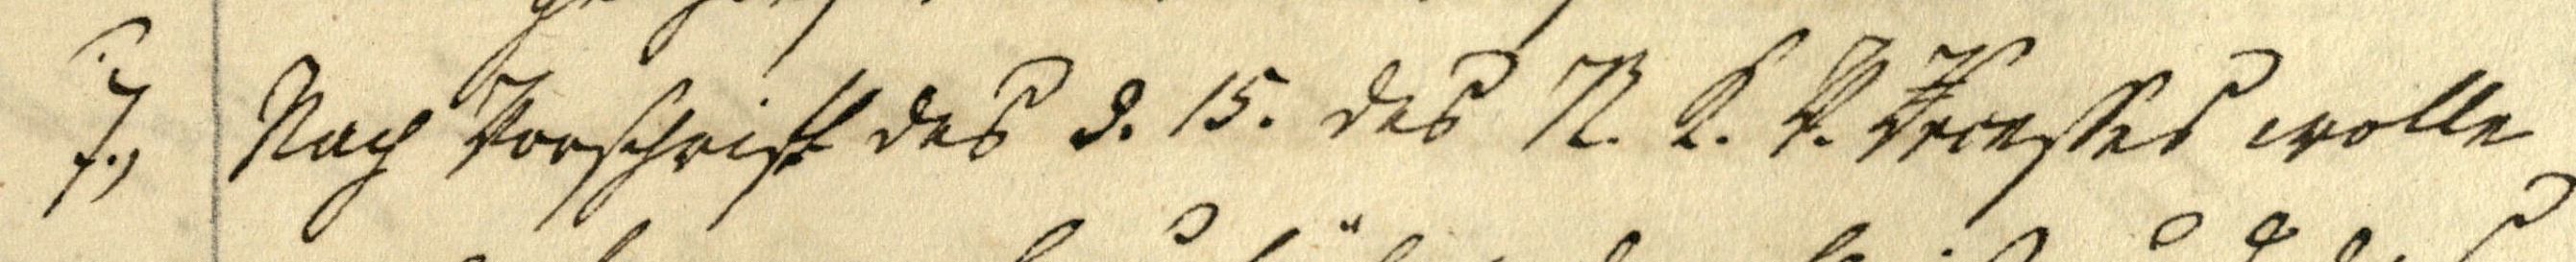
7. Nach Vorschrift des §. 15. des N. K. V. Recesses wolle
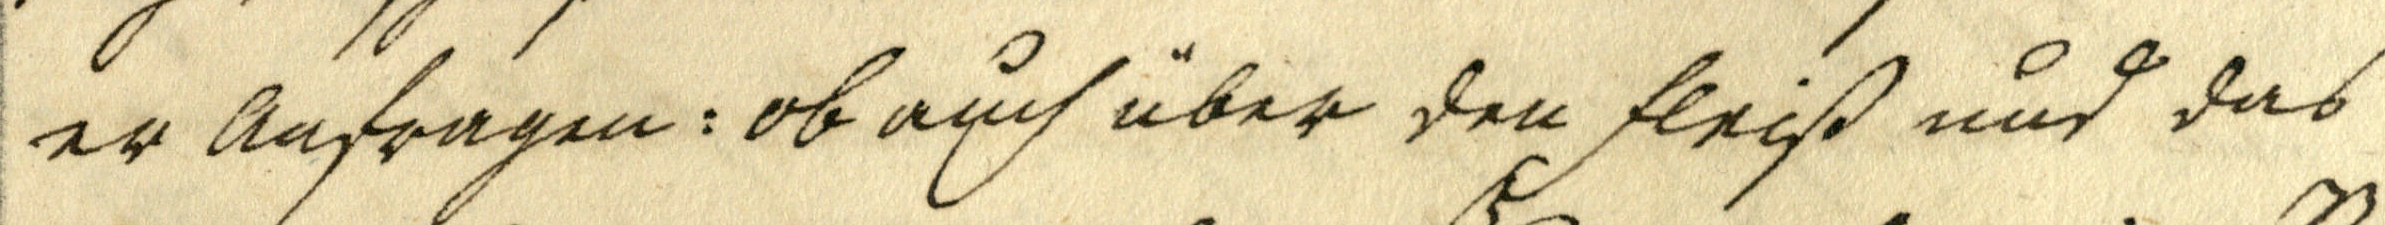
er anfragen: ob auch über den Fleiß und das
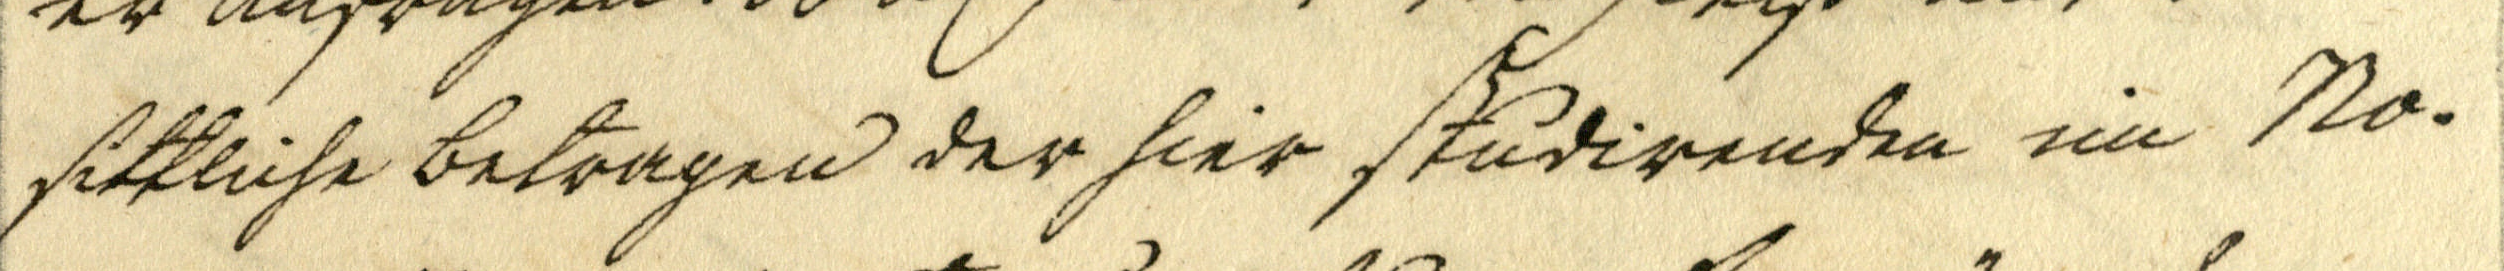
sittliche Betragen der hier Studirenden im No¬
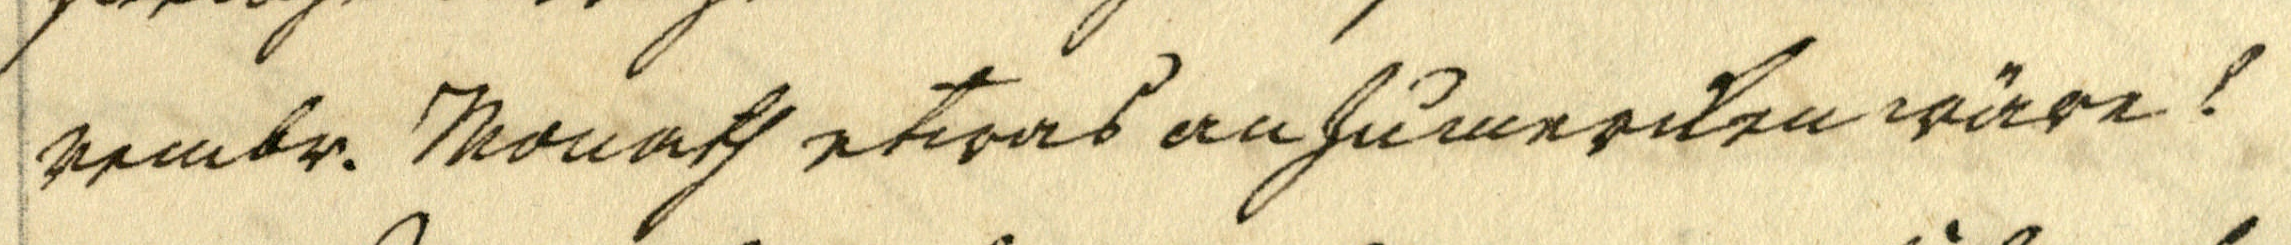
vember Monath etwas anzumerken wäre?
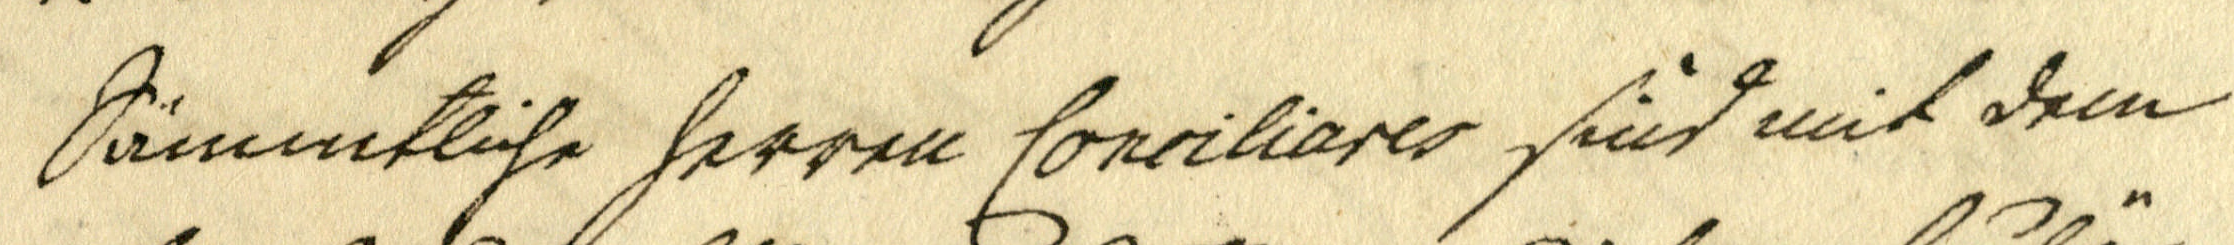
Sämmtliche Herren Conciliares sind mit dem
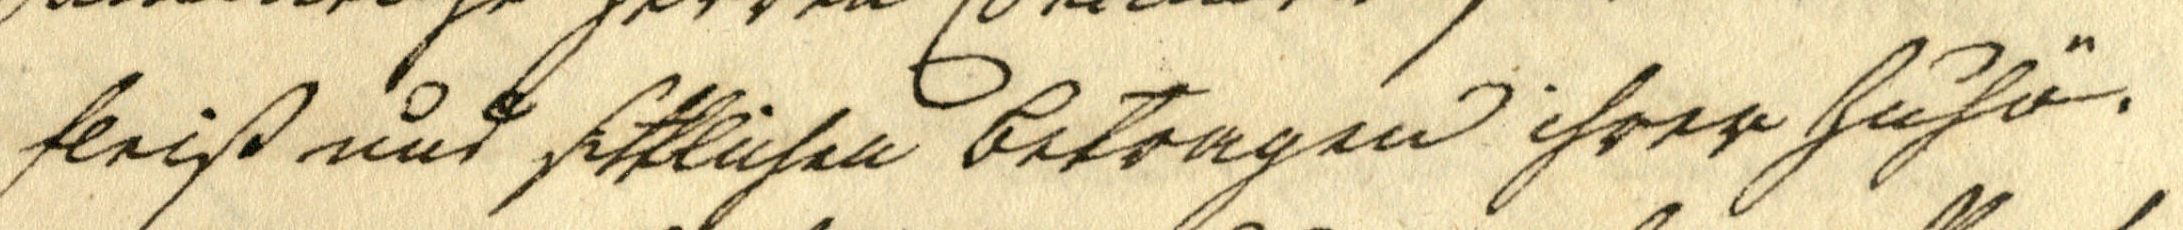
Fleiß und sittlichen Betragen ihrer Zuhö¬
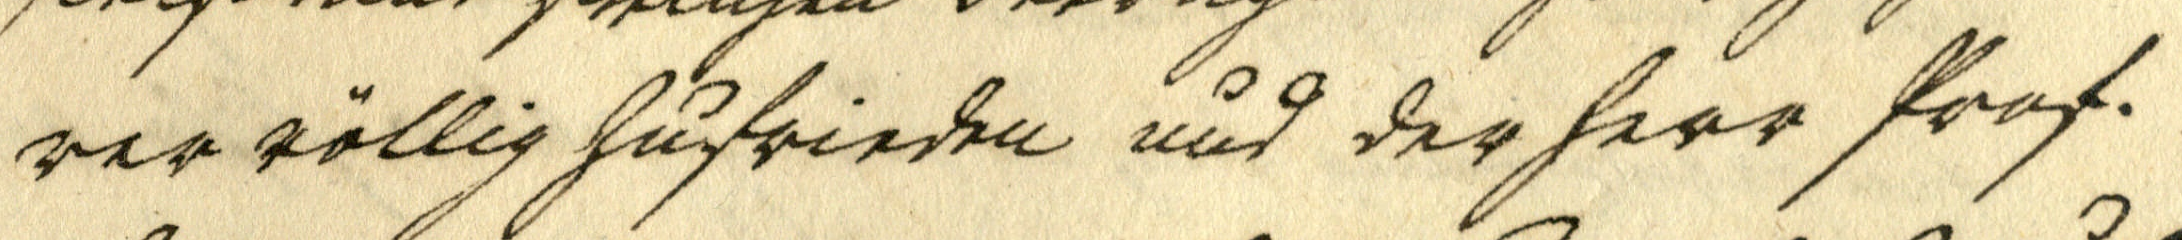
rer völlig zufrieden und der Herr Prof.
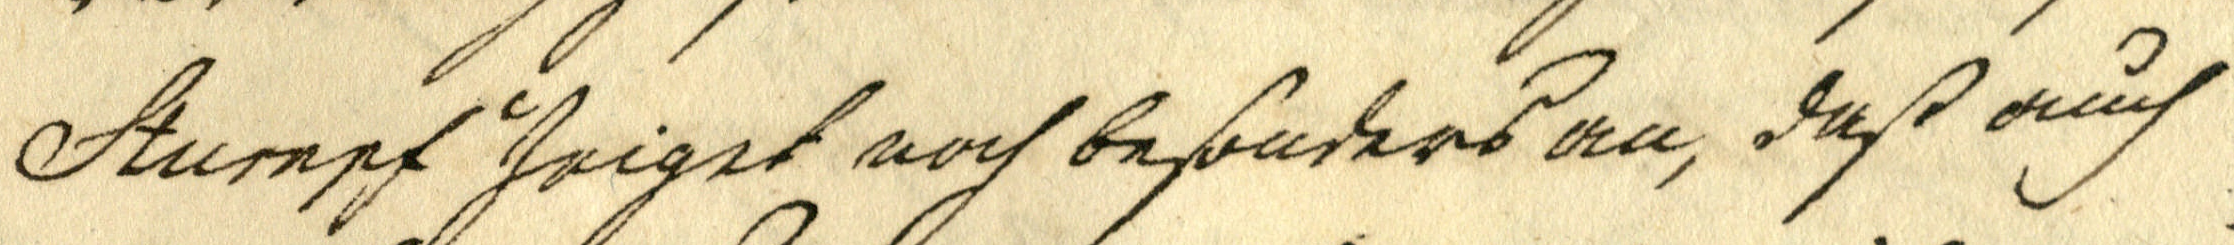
Stumpf zeiget noch besonders an, daß auch
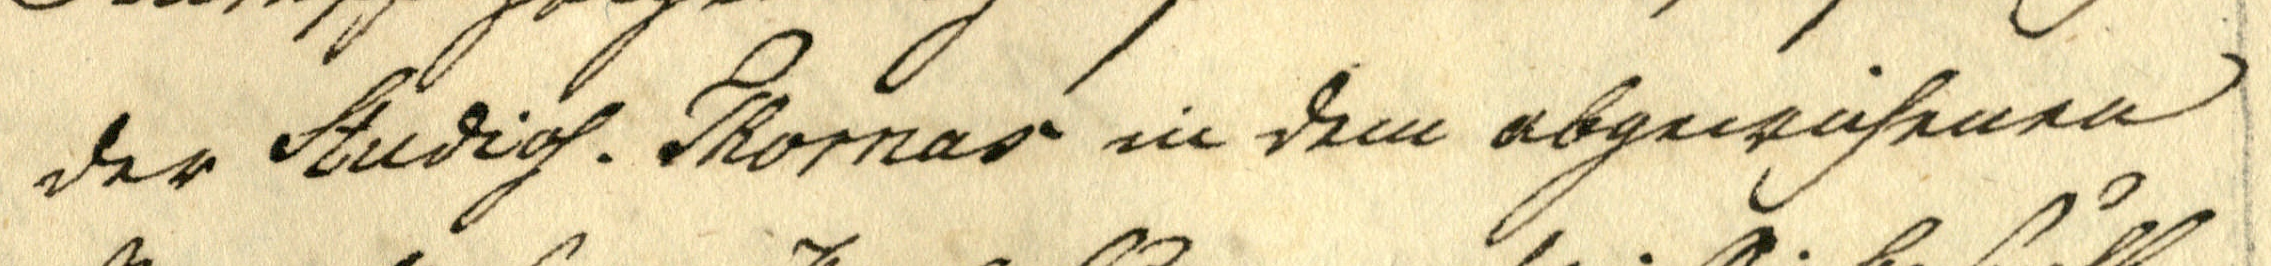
der Studios. Thomas in dem abgewichenen
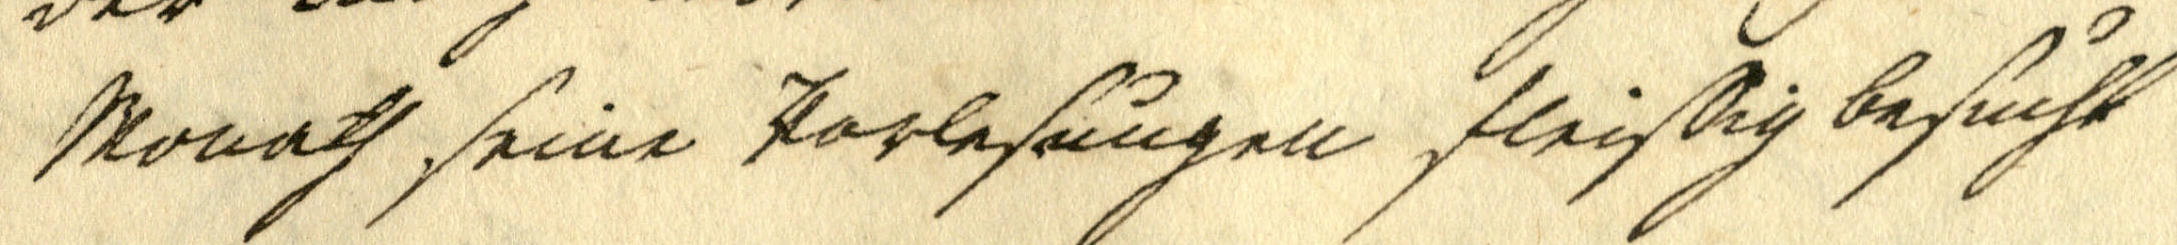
Monath seine Vorlesungen fleissig besucht
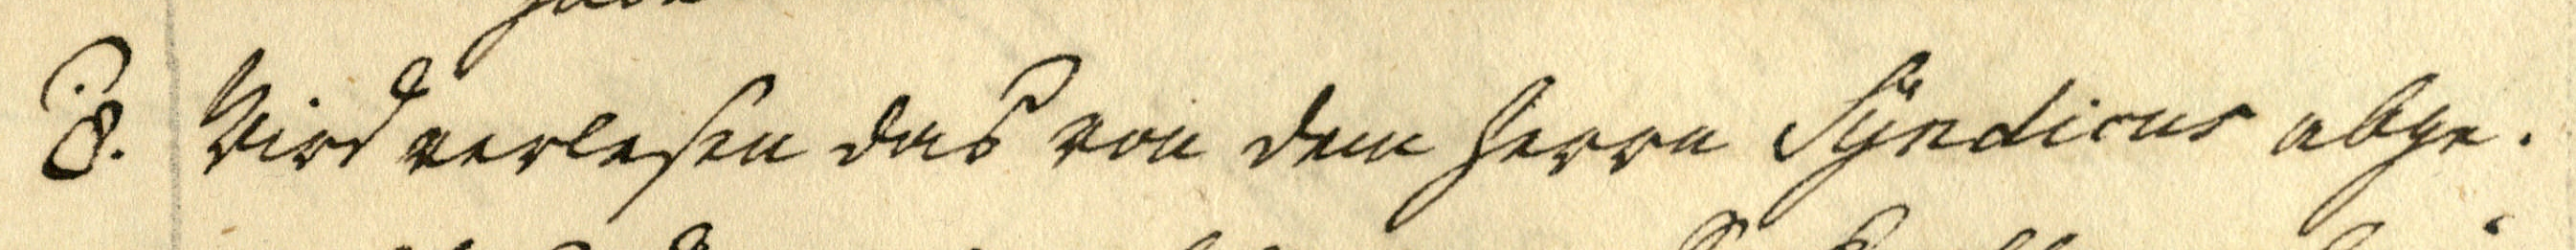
8. Wird verlesen das von dem Herrn Sÿndicus abge¬
